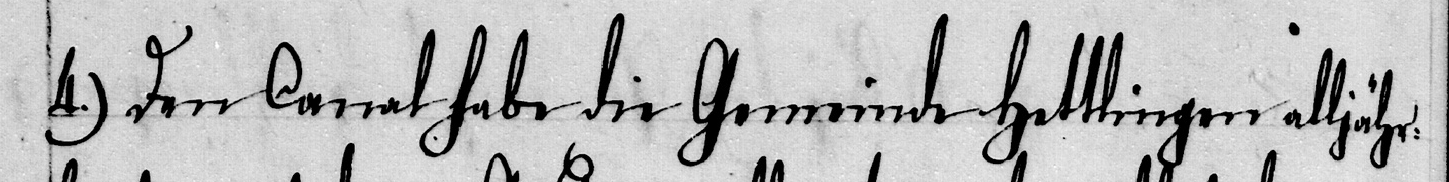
4.) Den Canal habe die Gemeinde Hettlingen allj¬
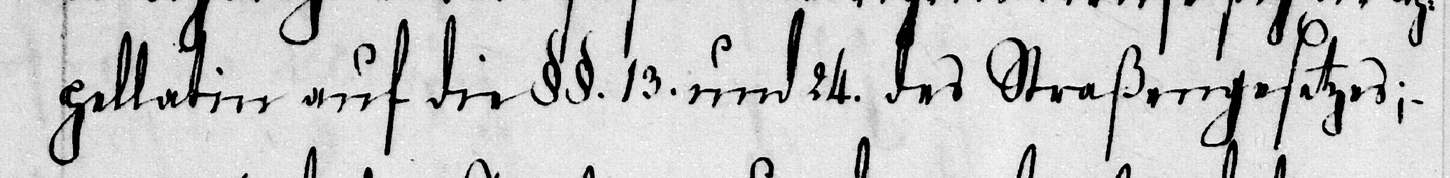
pellatin auf die §. §. 13. und 24. des Straßengesetzes;
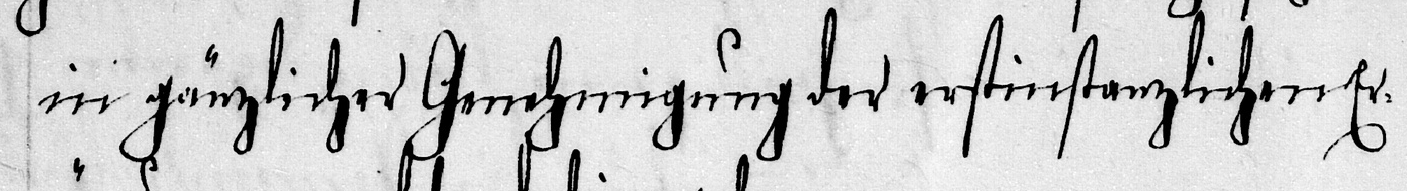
in gänzlicher Genehmigung der erstinstanzlichen Er¬
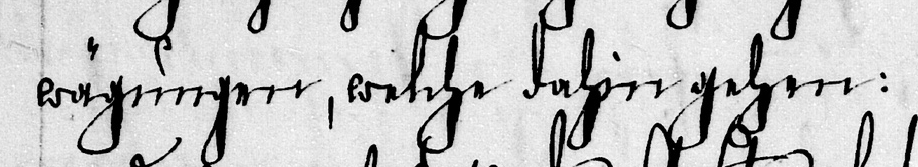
wägungen, welche dahin gehen:
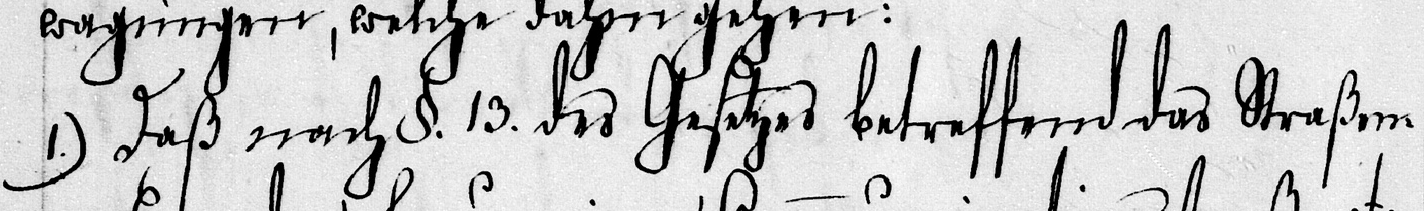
1.) Daß nach §. 13. des Gesetzes betreffend das Straßen¬
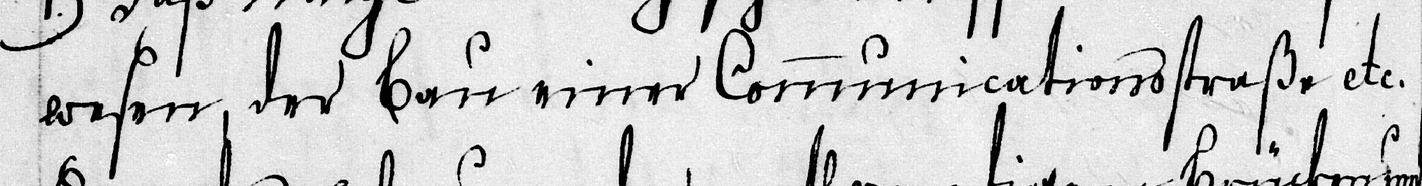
wesen, der Bau einer Communicationsstraße etc.
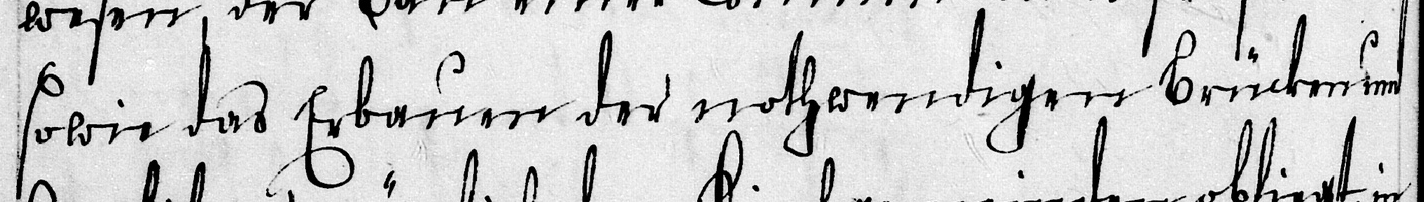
sowie das Erbauen der nothwendigen Brücken
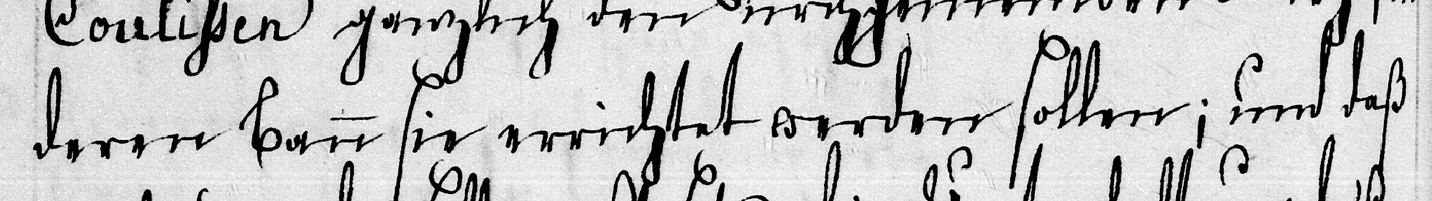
deren Bann sie errichtet werden sollen; und daß
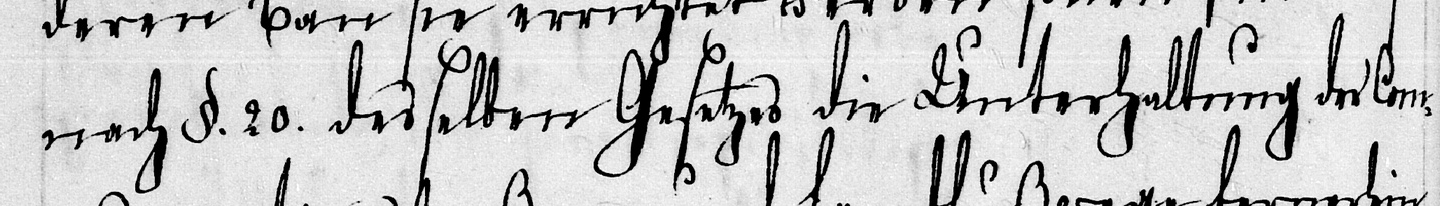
nach §. 20. desselben Gesetzes die Unterhaltung der C¬
